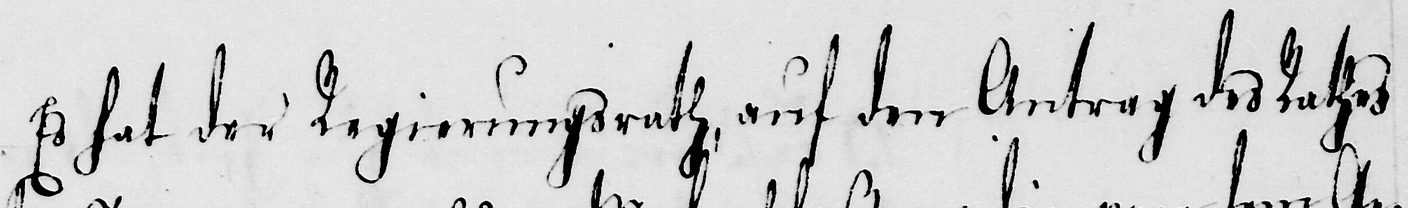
Es hat der Regierungsrath auf den Antrag des Rathes
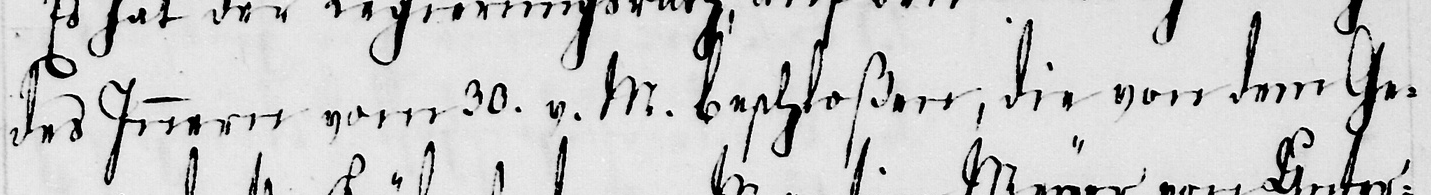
des Innern vom 30. v. M. beschloßen, die von dem Ge¬
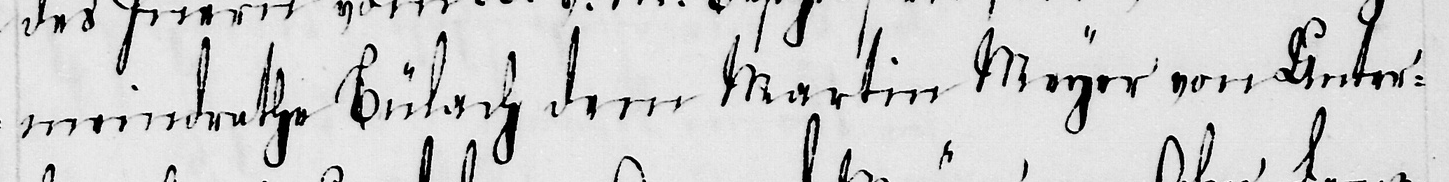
meindrathe Bülach dem Martin Meyer von Unter-L¬
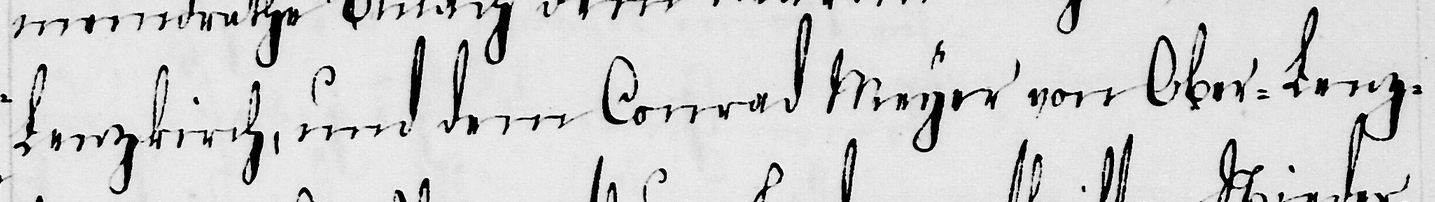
enzkirch, und dem Conrad Meyer von Ober-Lenz¬
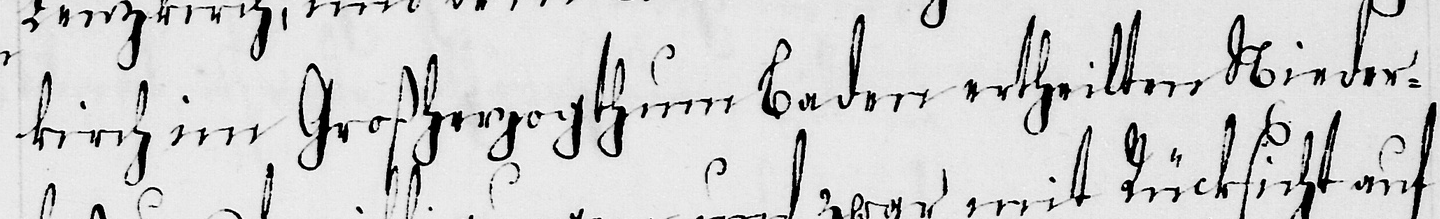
kirch im Großherzogthum Baden ertheilten Nieder¬
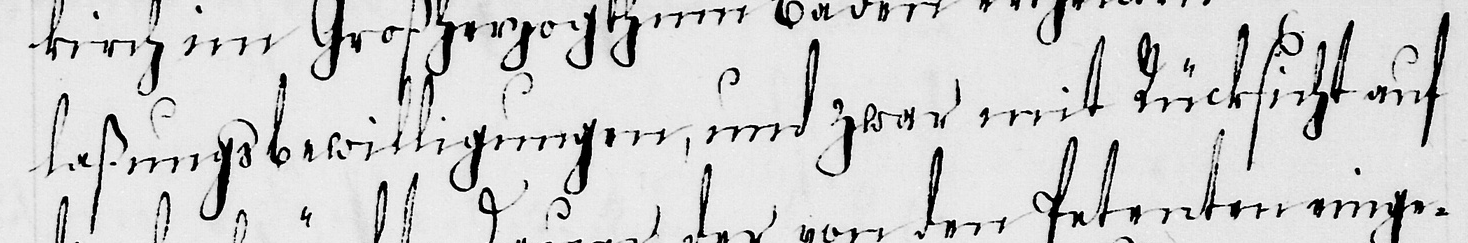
laßungsbewilligungen, und zwar mit Rücksicht auf
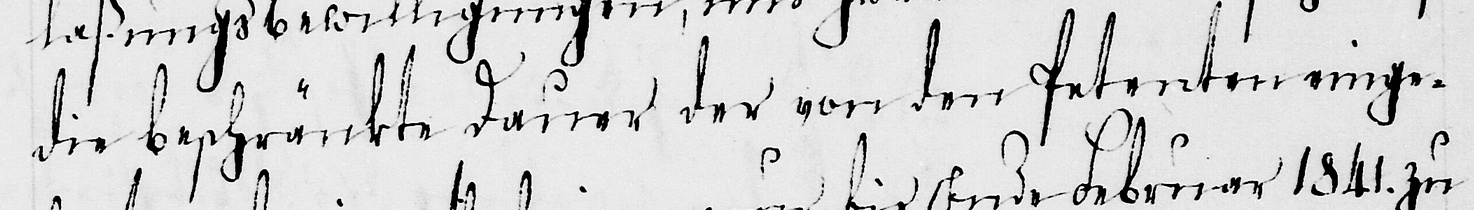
die beschränkte Dauer der von den Petenten einge¬
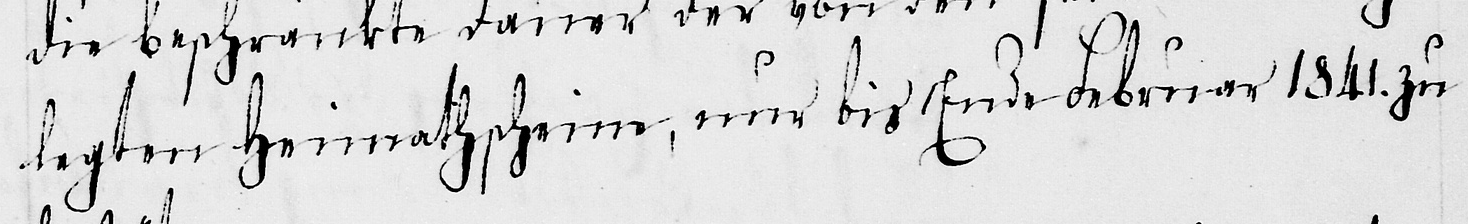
legten Heimathscheine, nur bis Ende Februar 1841 zu
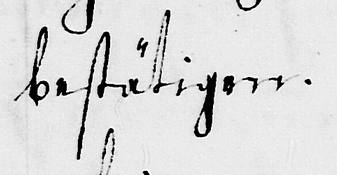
bestätigen.
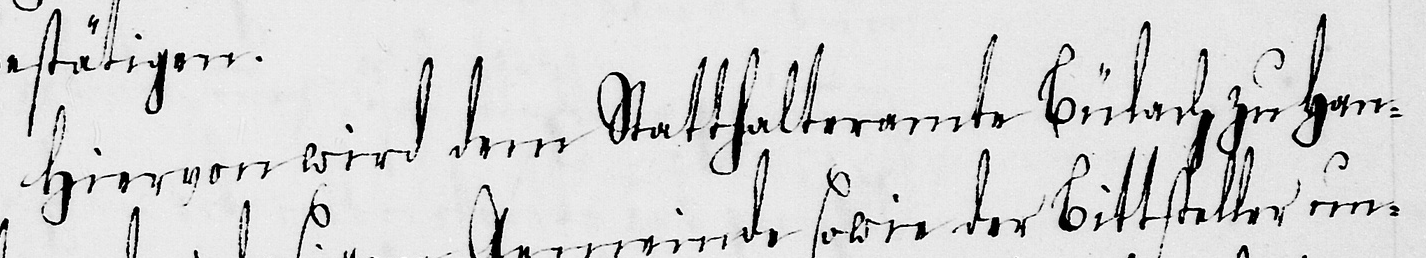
Hiervon wird dem Statthalteramte Bülach zu Han¬
